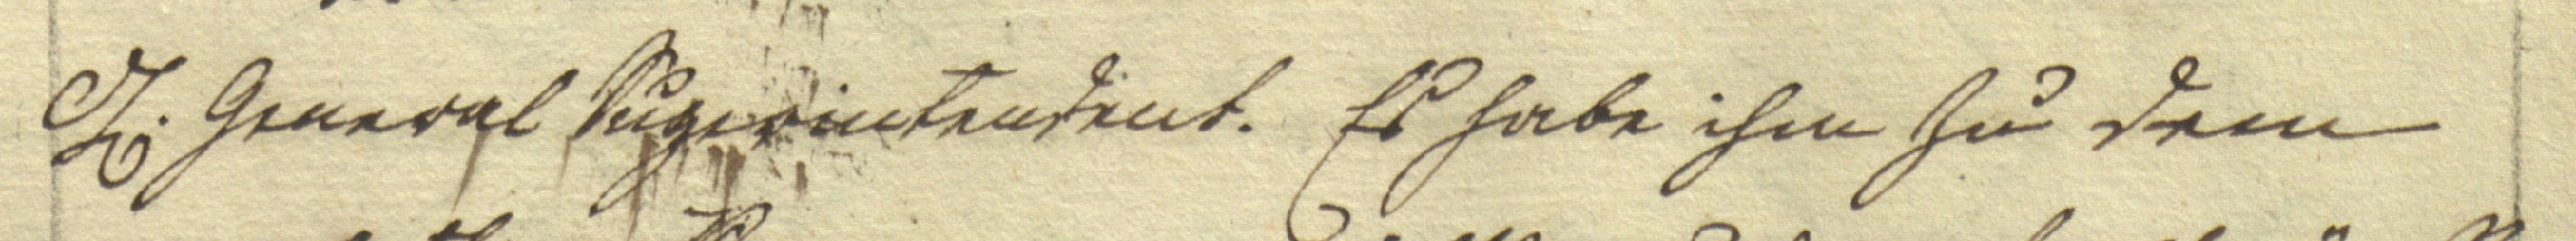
dh. General Superintendent. Es habe ihm zu dem
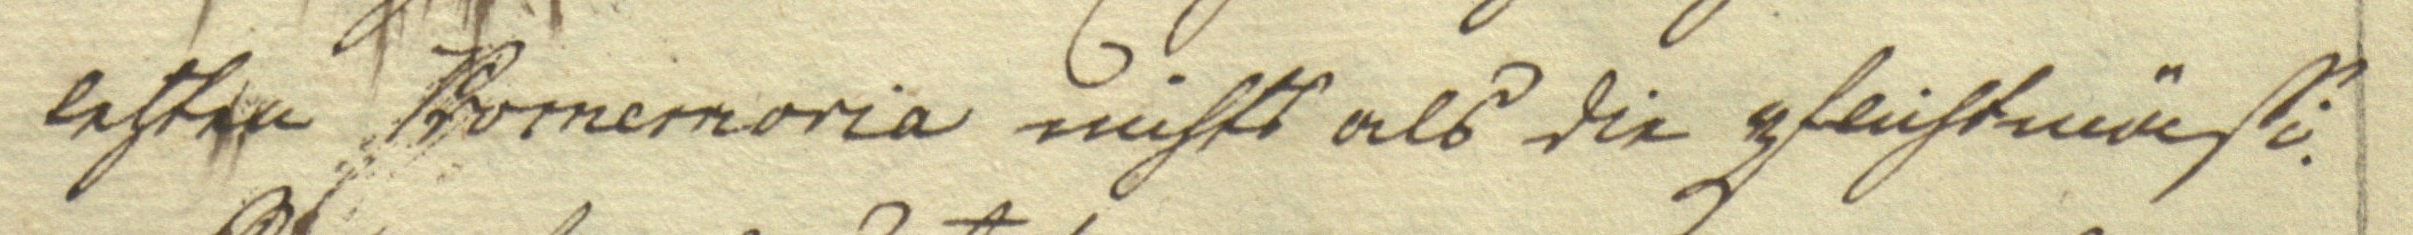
letzten Promemoria nichts als die pflichtmässi¬
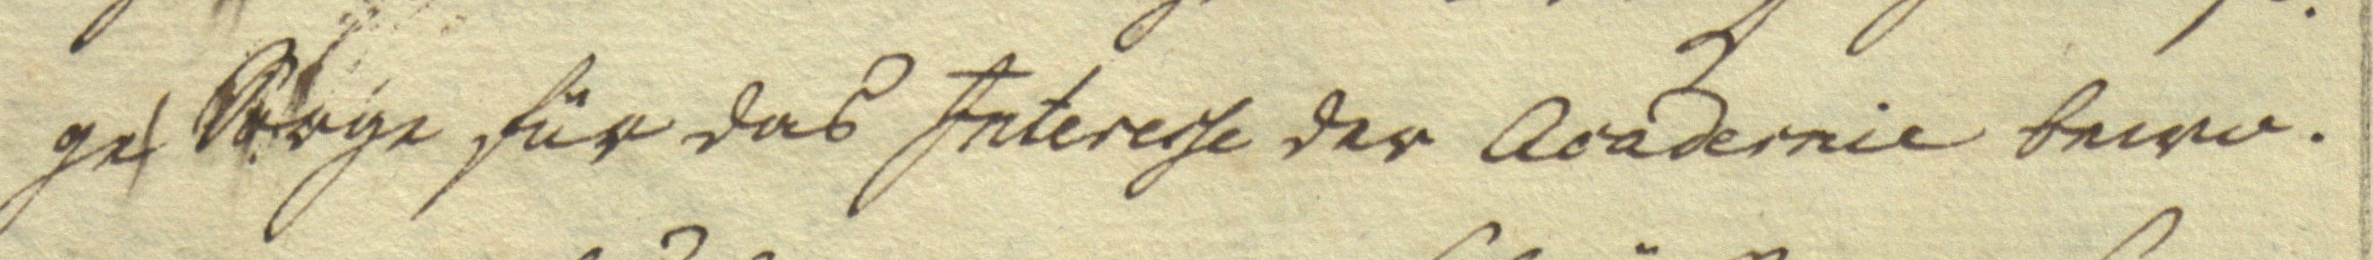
ge Sorge für das Interesse der Academie bewo¬
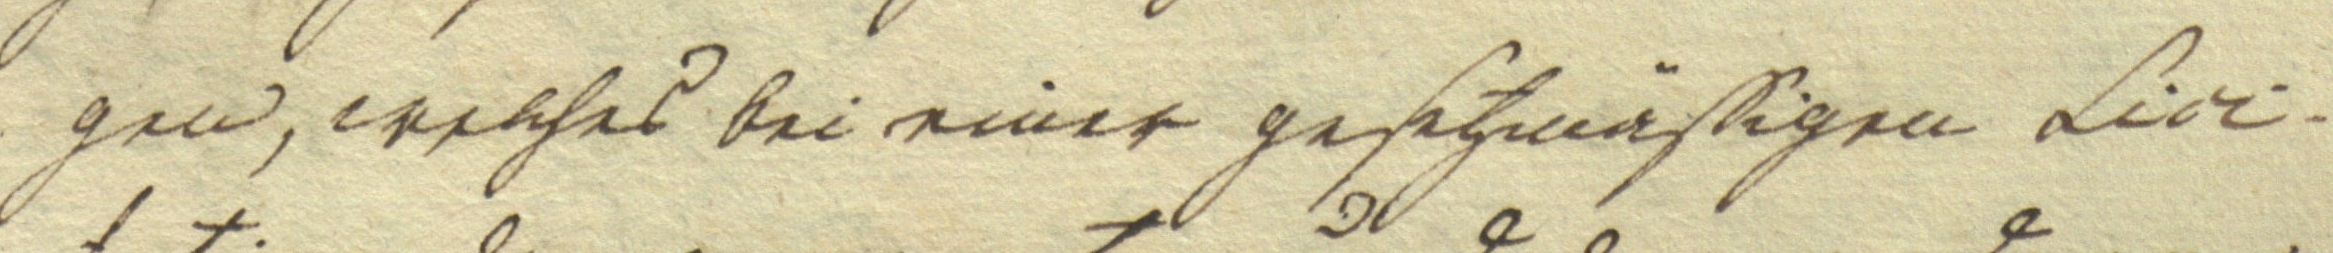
gen, welches bei einer gesetzmässigen Lici¬
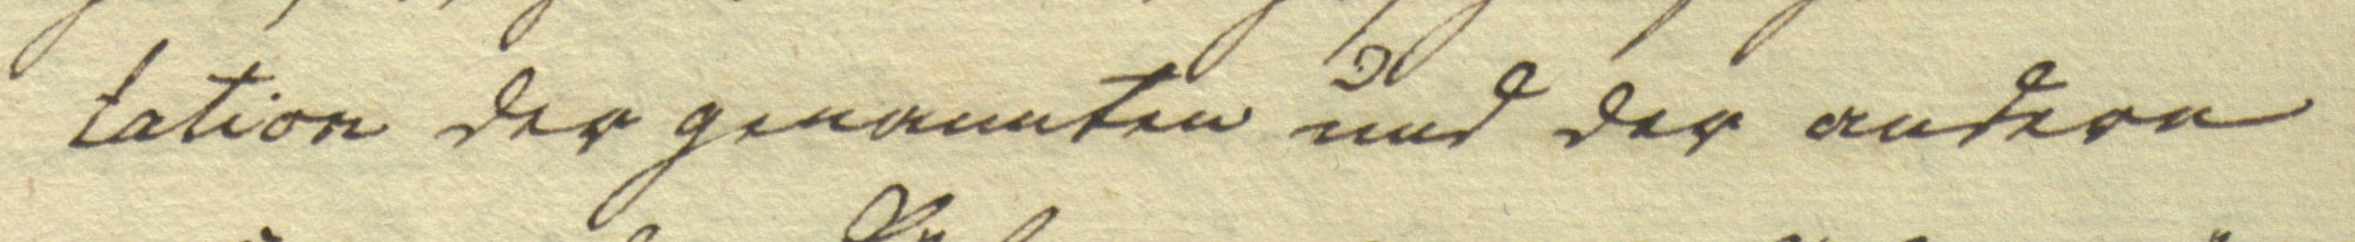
tation der genannten und der andern
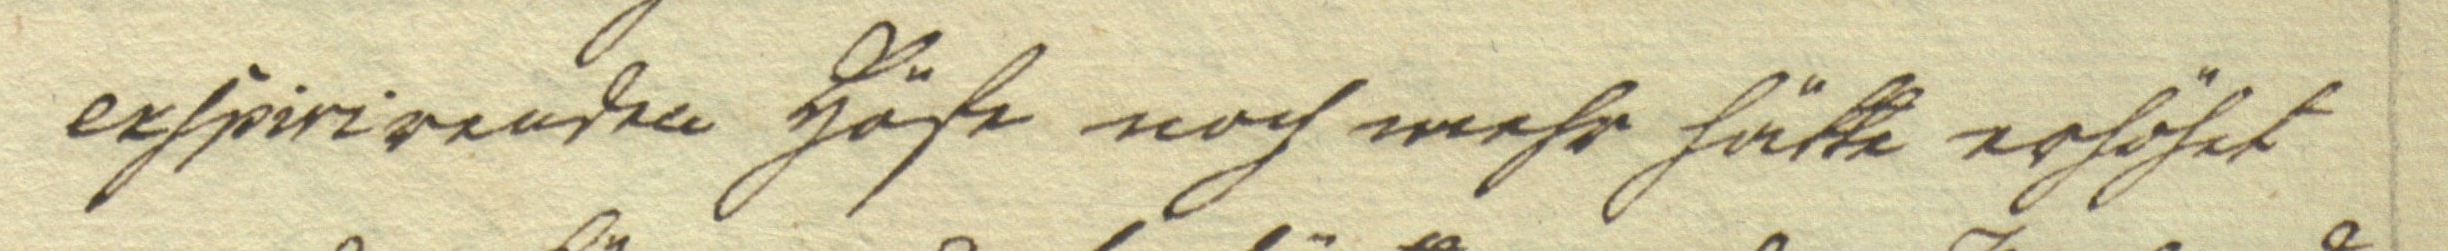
exspirirenden Höfe noch mehr hätte erhöhet
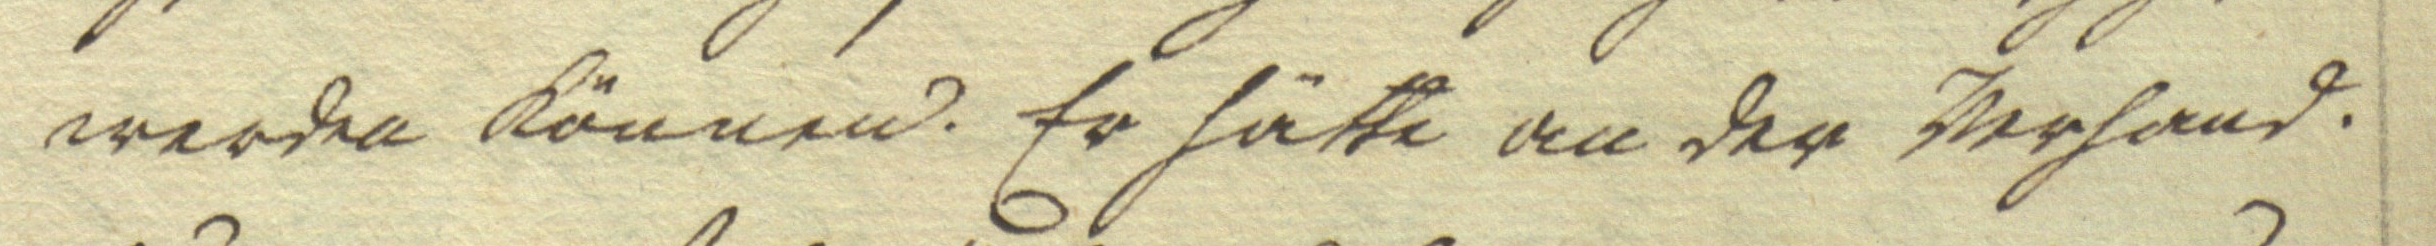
werden können. Er hätte an der Verhand¬
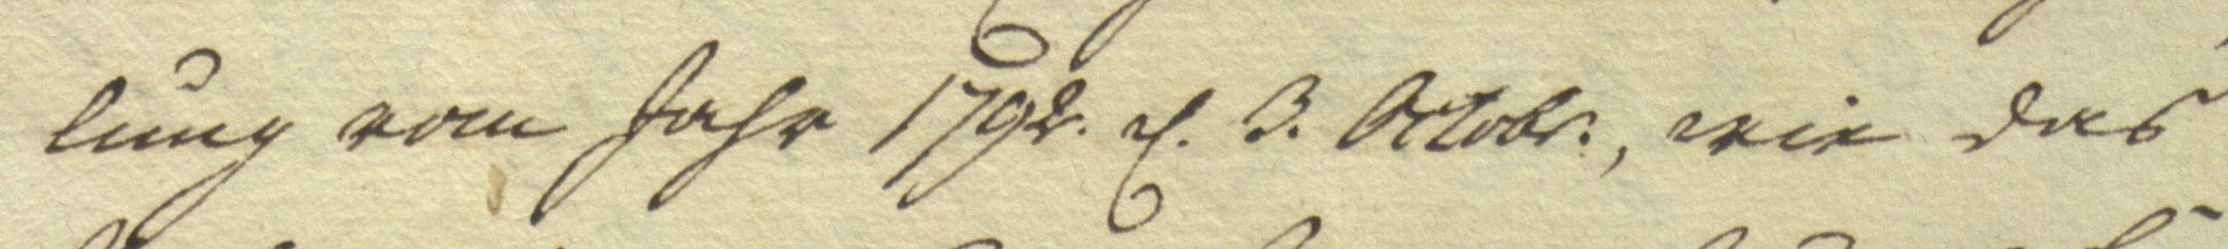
lung vom Jahr 1792. d. 3. Octobr., wie das
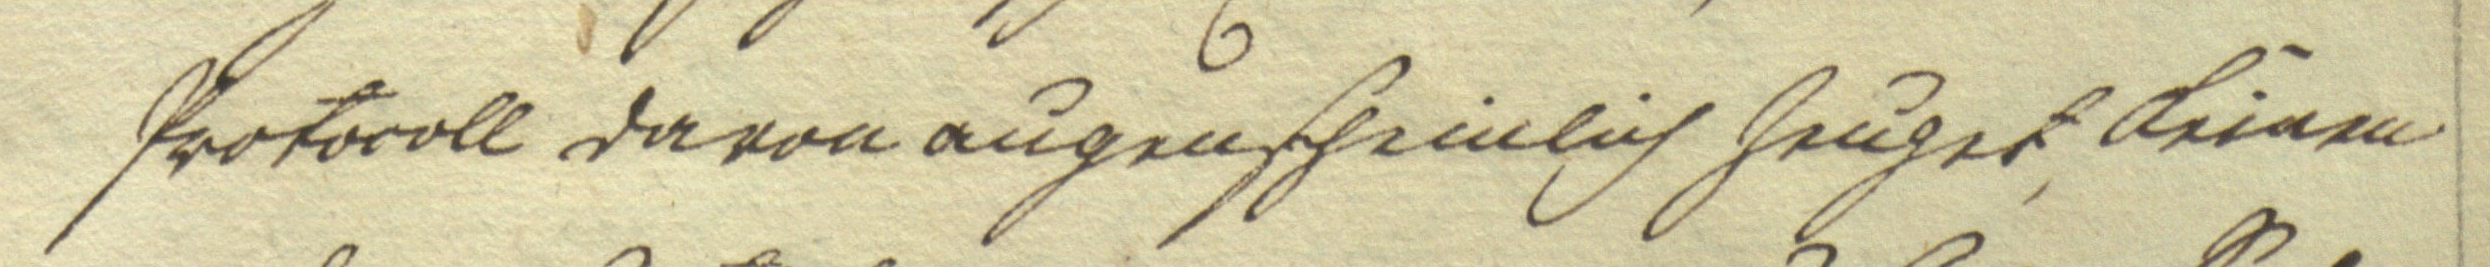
Protocoll davon augenscheinlich zeuget, keinen
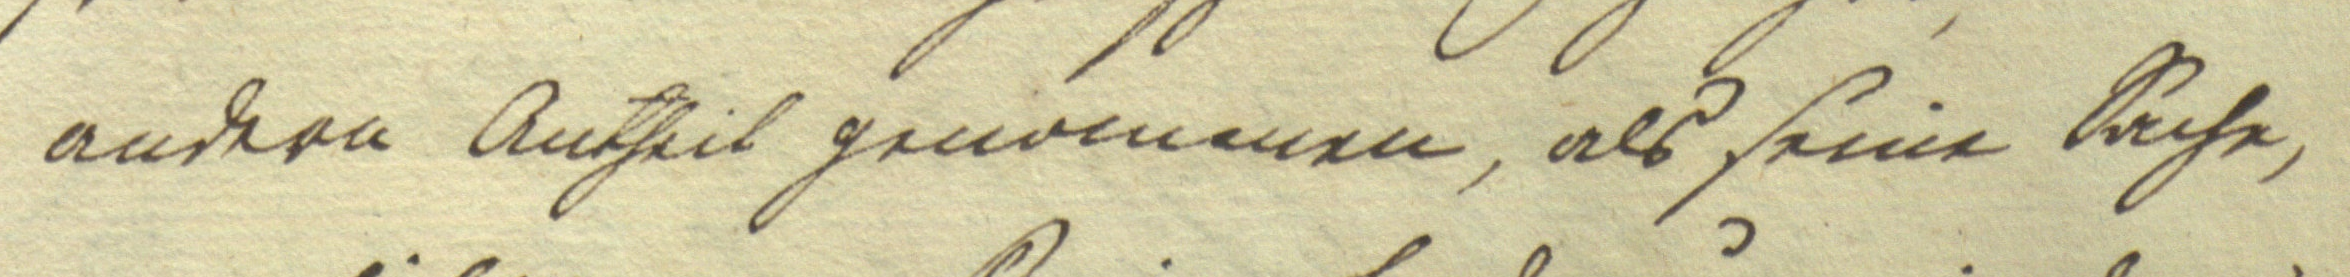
andern Antheil genommen, als seine Sache,
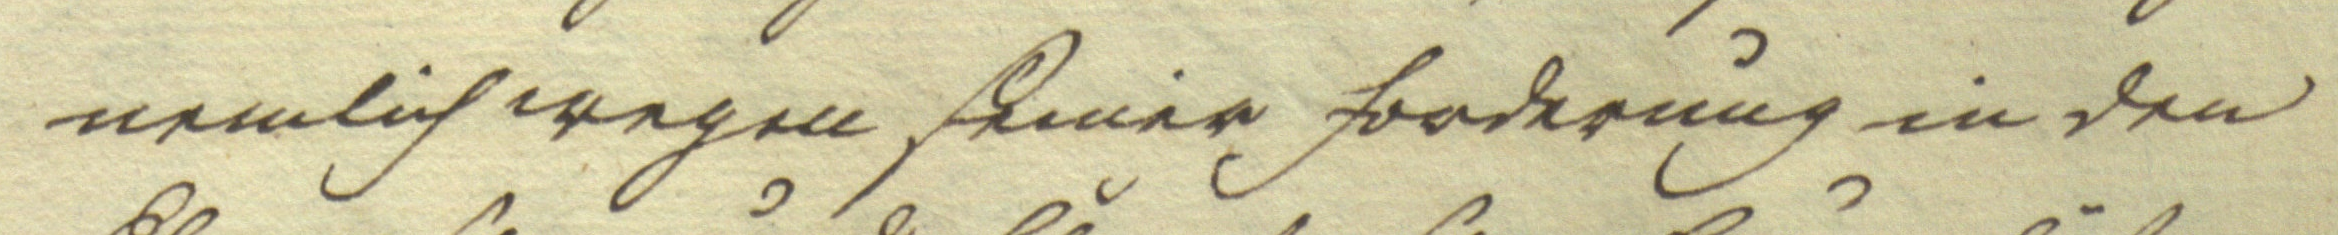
nemlich wegen seiner Forderung in den
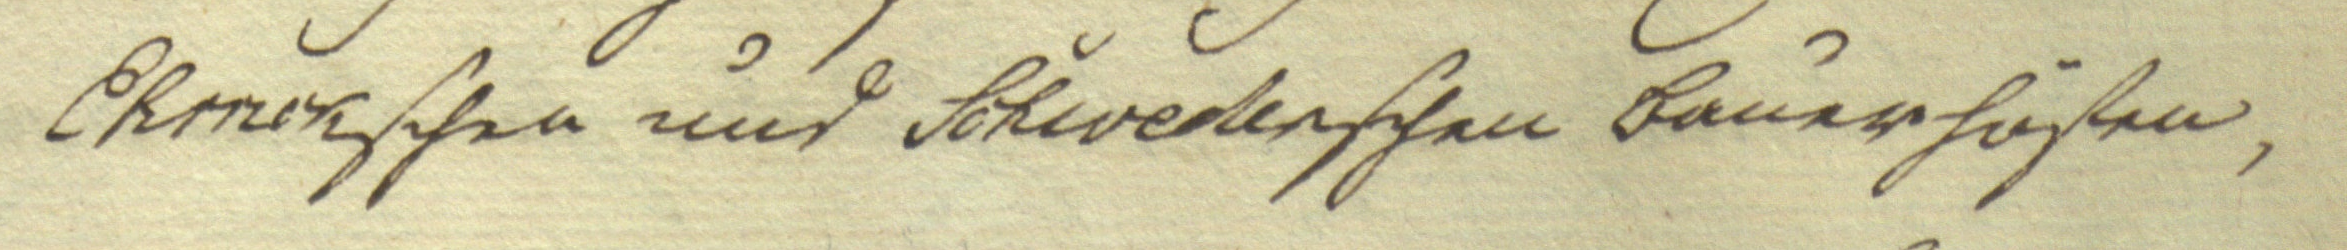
Ehmckschen und Schwederschen Bauerhöfen,
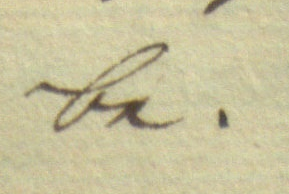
be¬
